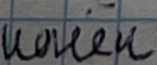конёк
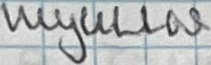тусклая
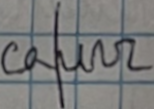сарыч
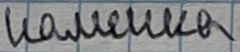каменка
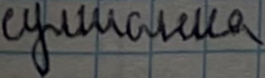султанка
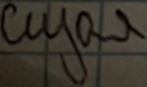сизая
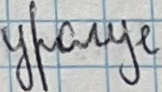урагус
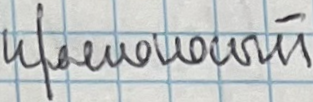красноносый
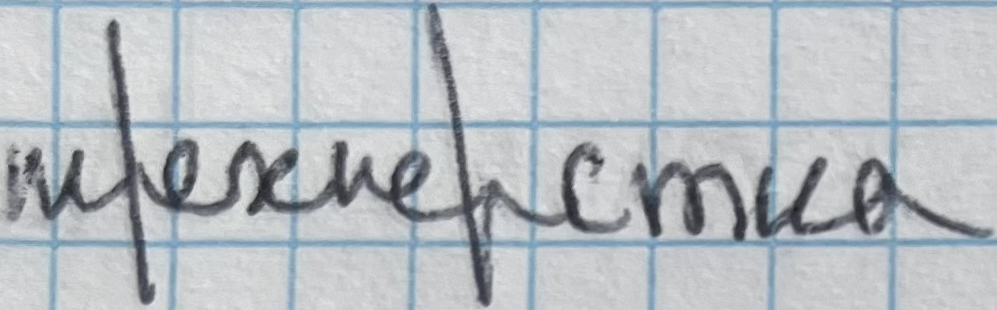трехперстка
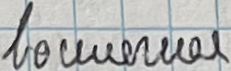восточная
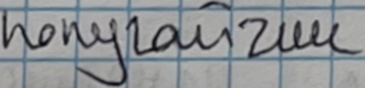попугайчик
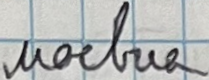моевка
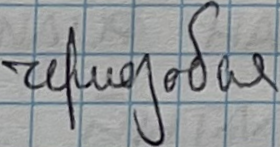чернозобая
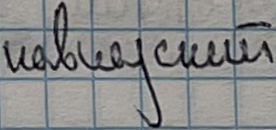кавказский
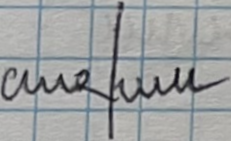старик
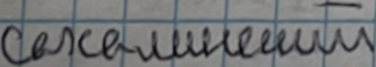сахалинский
